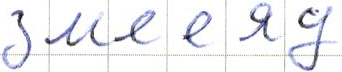змееяд
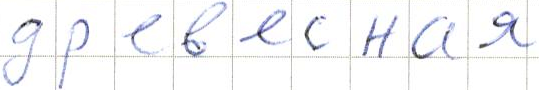древесная
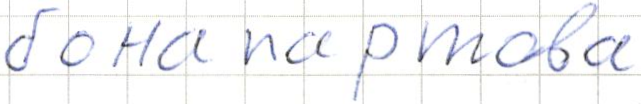бонапартова
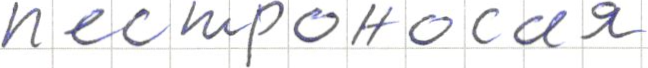пестроносая
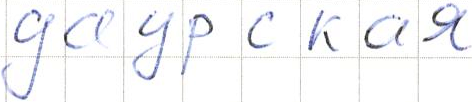даурская
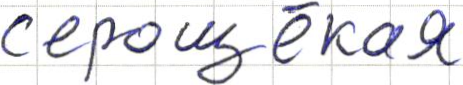серощёкая
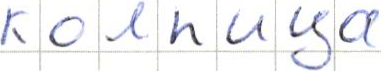колпица
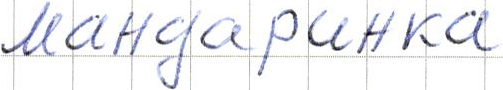мандаринка
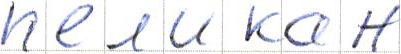пеликан
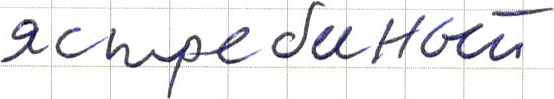ястребиный
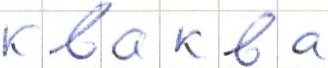кваква
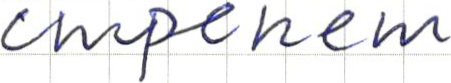стрепет
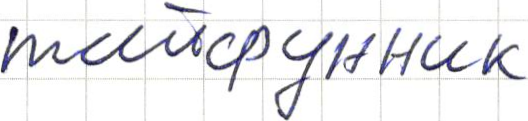тайфунник
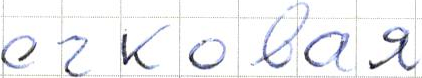очковая
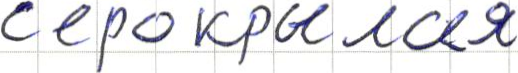серокрылая
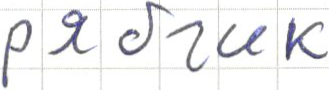рябчик
